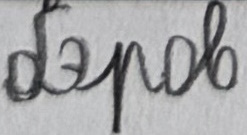бэров
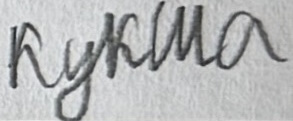кукша
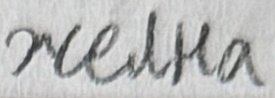желна
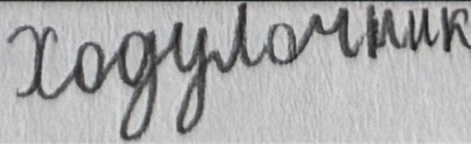ходулочник
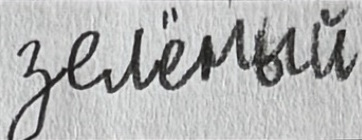зелёный
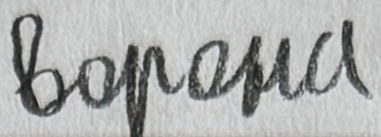ворона
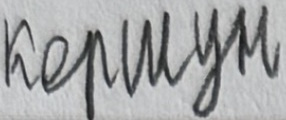кершун
